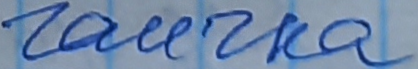гаичка
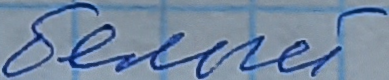белый
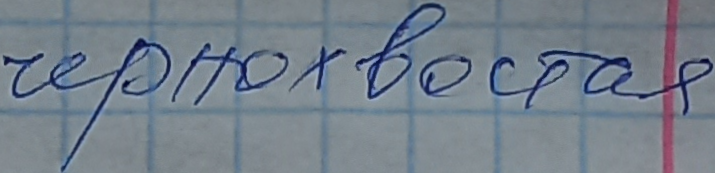чернохвостая
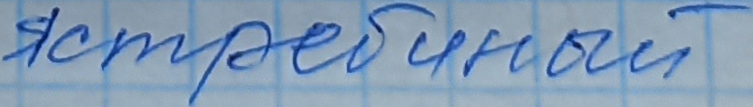ястребиный
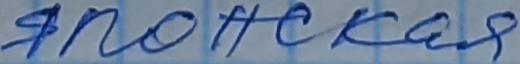японская
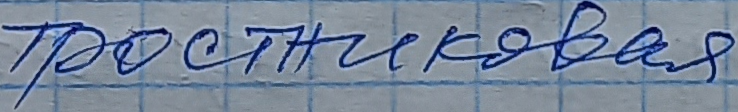тростниковая
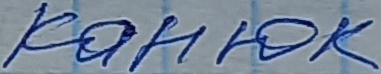канюк
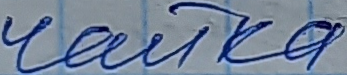чайка
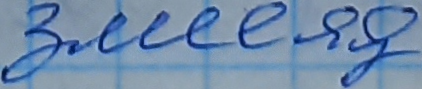змееяд
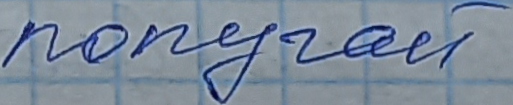попугай
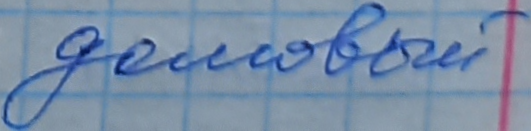домовый
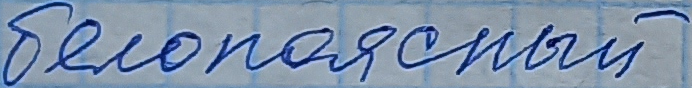белопоясный
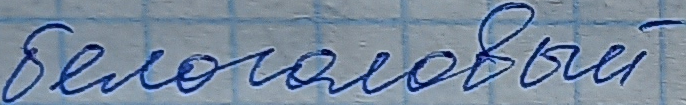белоголовый
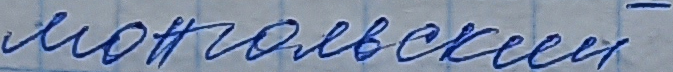монгольский
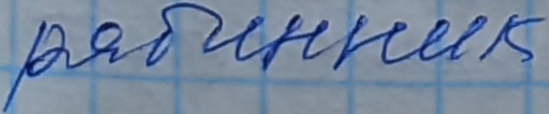рябинник
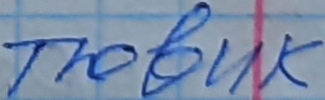тювик
